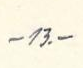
13
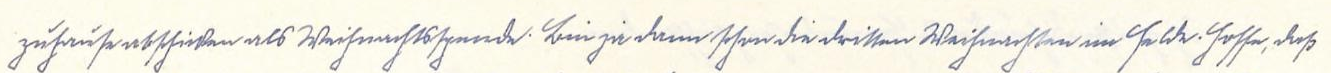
zu Hause abschicken als Weihnachtsspende. Bin ja dann schon die dritten Weihnachten im Felde. Hoffe, dass
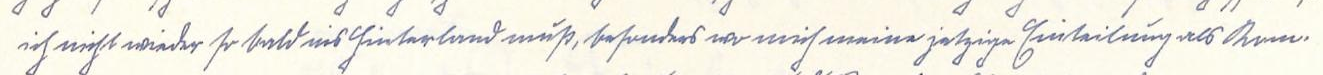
ich nicht wieder so bald ins Hinterland muss, besonders wo mich meine jetzige Einteilung als Kom-
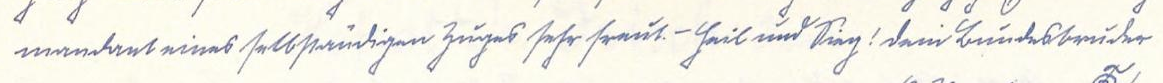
mandant eines selbstständigen Zuges sehr freut. Heil und Sieg! Dein Bundesbruder
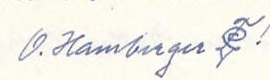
O. Hamberger Cl!
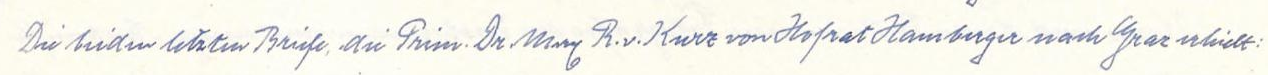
Die beiden letzten Briefe, die Prim. Dr. Max R. v. Kurz von Hofrat Hamberger nach Graz erhielt:
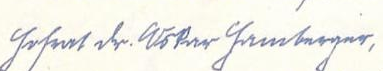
1. Hofrat Dr. Oskar Hamberger,
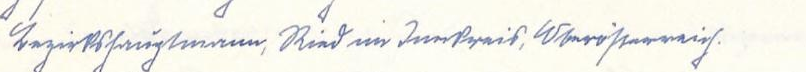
Bezirkshauptmann, Ried im Innkreis Oberösterreich.
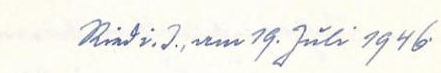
Ried. i. I. am 19. Juli 1946
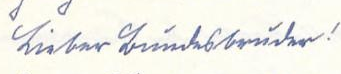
Lieber Bundesbruder!
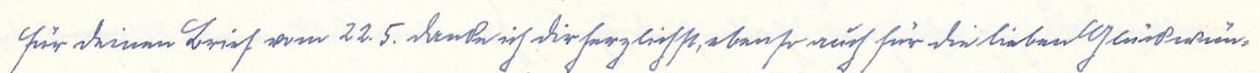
Für deinen Brief vom 22.5. danke ich dir herzlichst, ebenso auch für die lieben Glückwün-
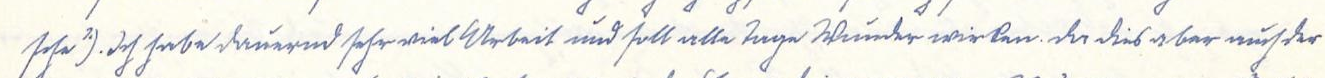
sche 2). Ich habe dauernd sehr viel Arbeit und soll alle Tage Wunder wirken. D dies aber auch der
